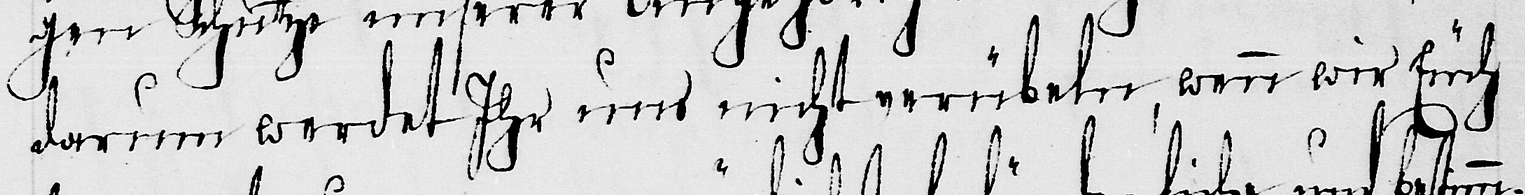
darum werdet Ihr uns nicht verübeln, wenn wir Euch
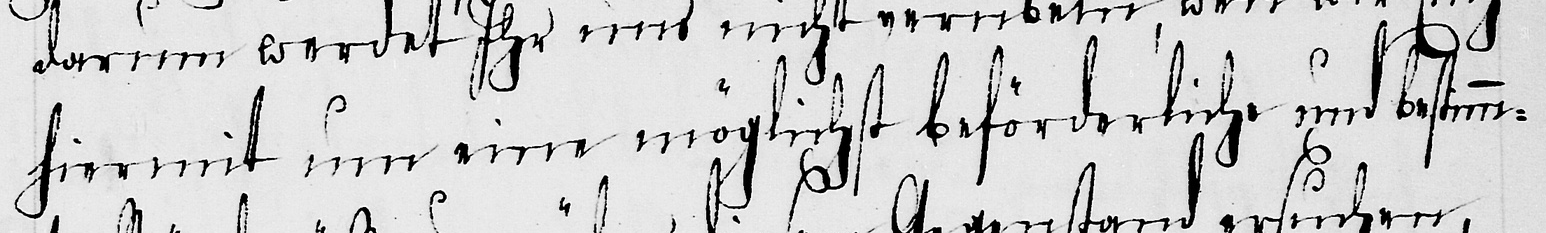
hiermit um eine möglichst beförderliche und besti¬
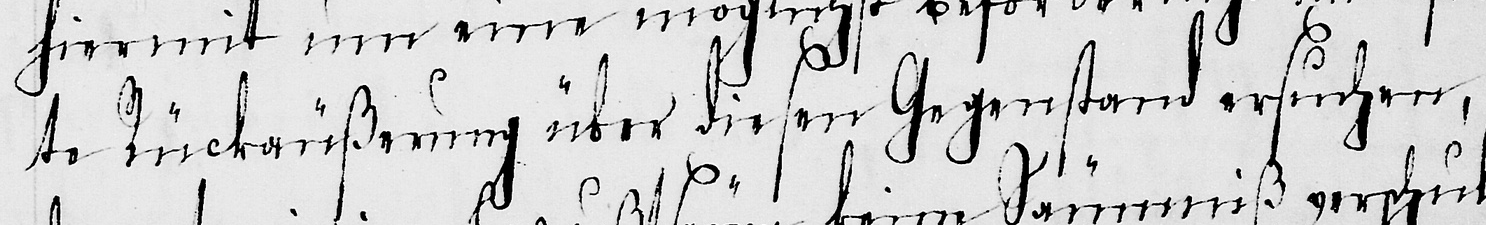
te Rückäußerung über diesen Gegenstand ersuchen,
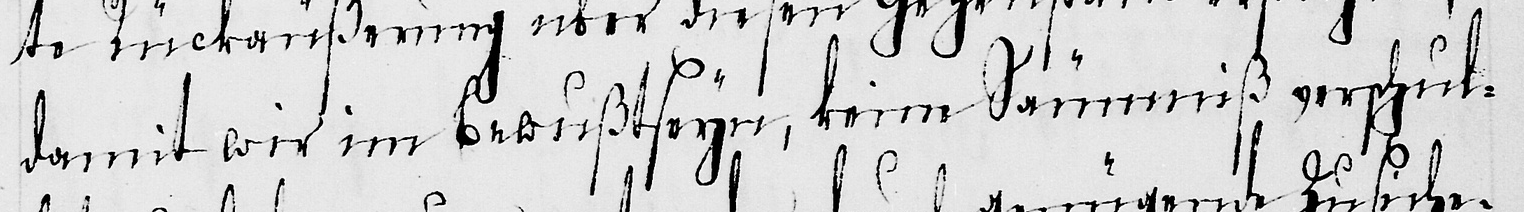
damit wir im Bewußtseyn, keine Säumniß verschul¬
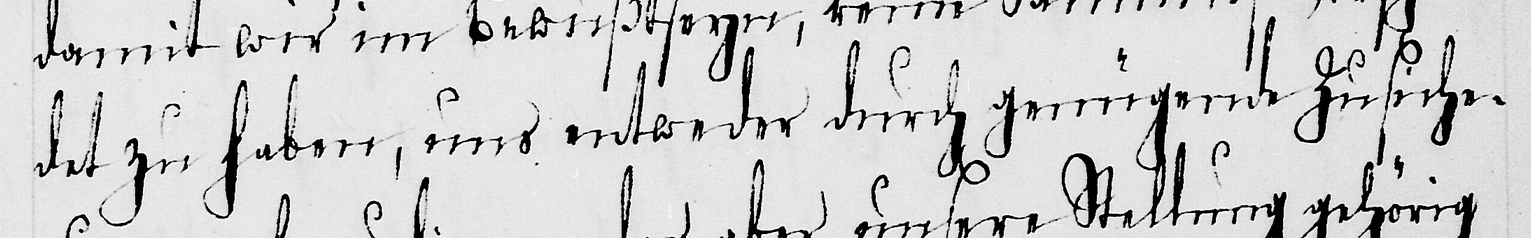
det zu haben, uns entweder durch genügende Zusiche¬
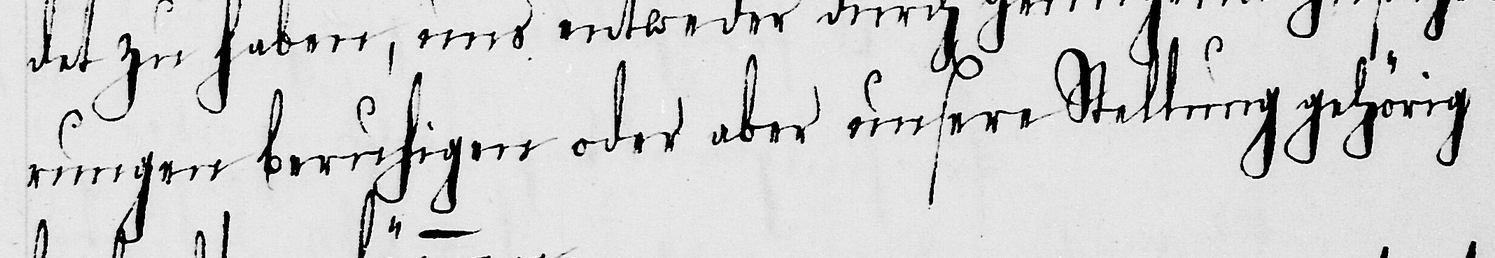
rungen beruhigen oder aber unsere Stellung gehörig
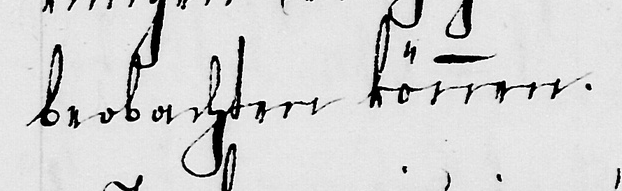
beobachten können.
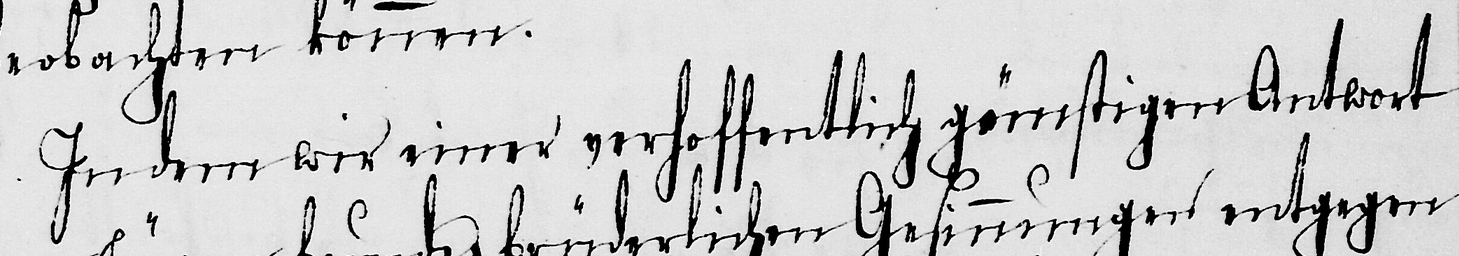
In dem wir einer verhoffentlich günstigen Antwort
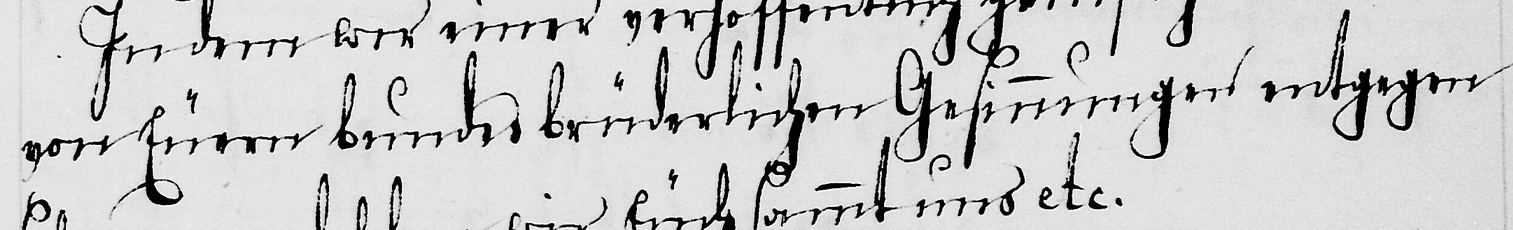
von Euern bundesbrüderlichen Gesinnungen entgegen
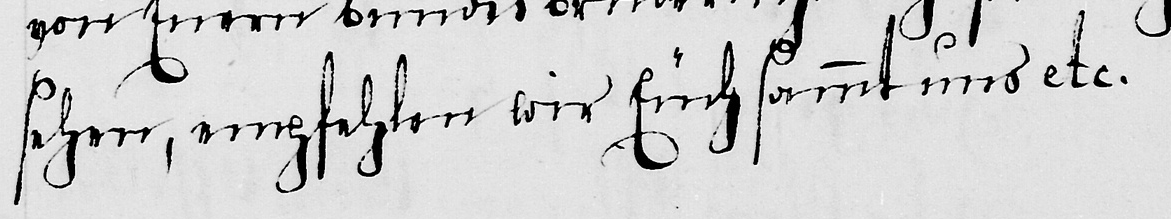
sehen, empfehlen wir Euch sammt uns etc.
